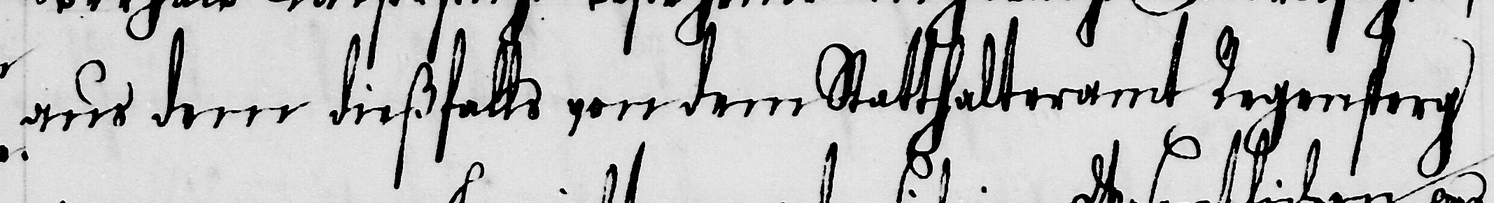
aus dem dießfalls von dem Statthalteramt Regensperg
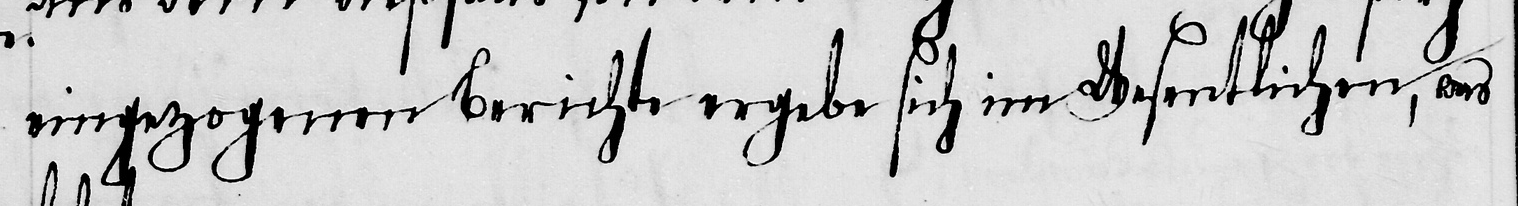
eingezogenen Berichte ergebe sich im Wesentlichen, was
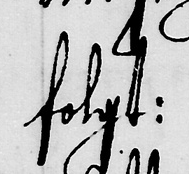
fall,
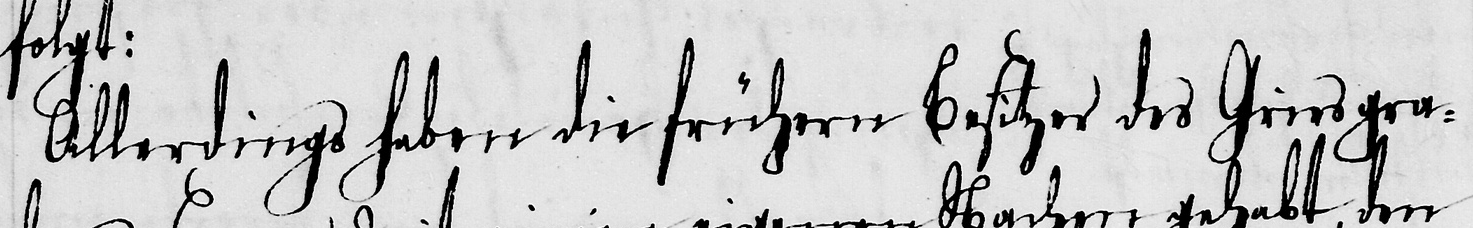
Allerdings haben die frühern Besitzer des Griesgra¬
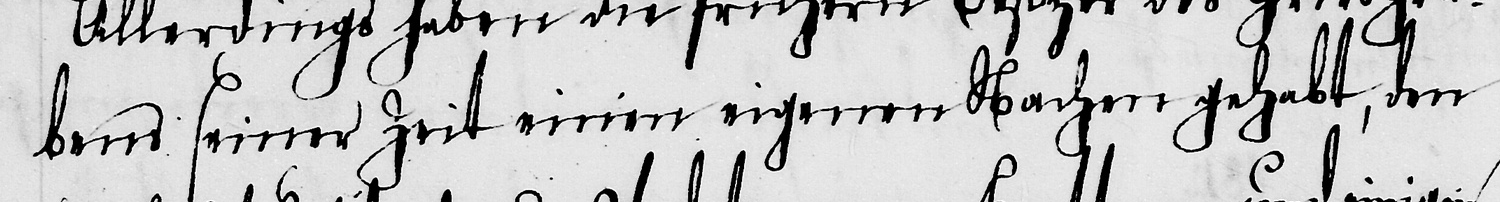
bens seiner Zeit einen eigenen Nachen gehabt, den
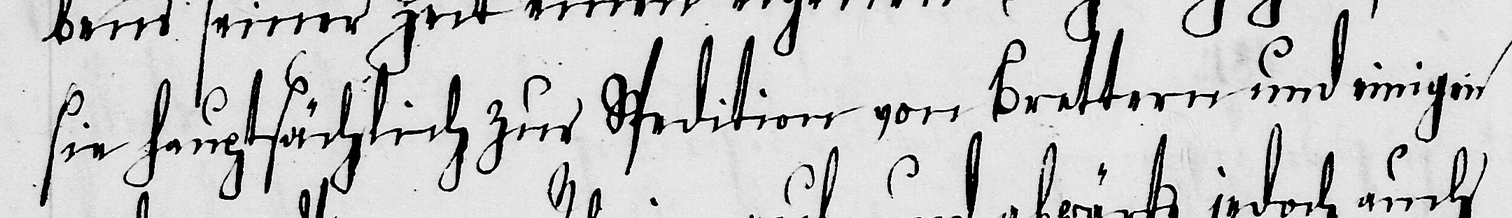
sie hauptsächlich zur Spedition von Brettern und einigen
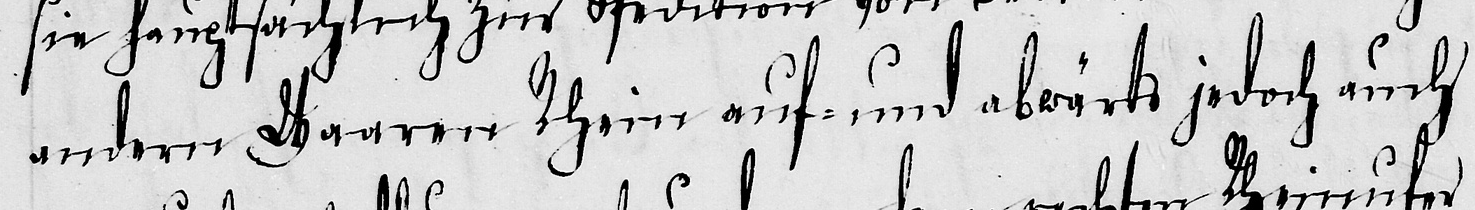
andern Waaren Rhein auf- und abwärts jedoch auch
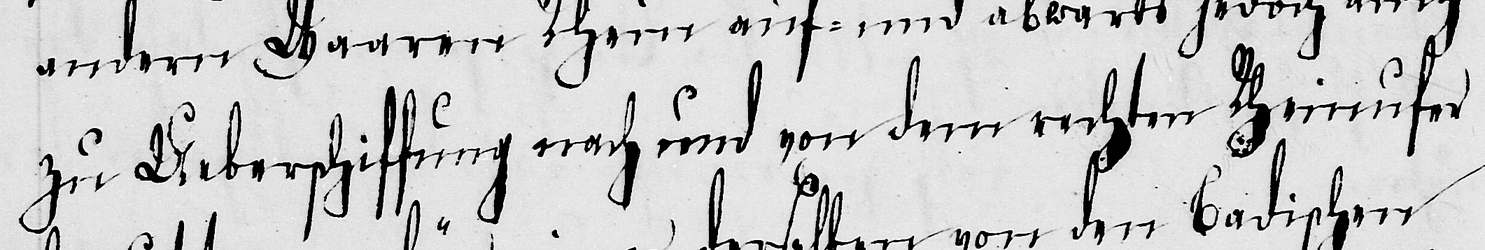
zu Ueberschiffung nach und von dem rechten Rheinufer
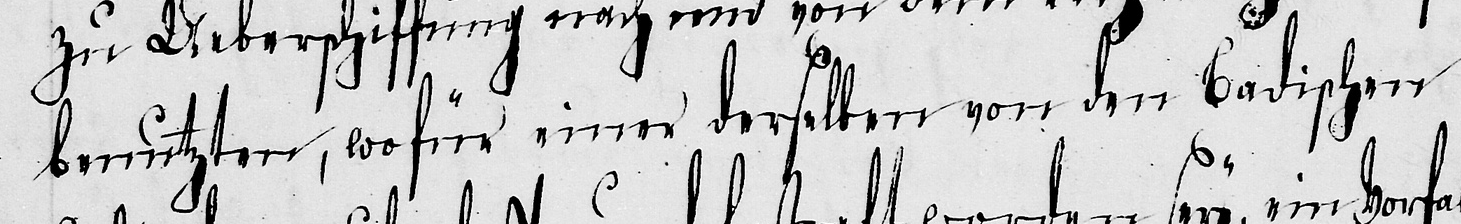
benutzten, wofür einer derselben von den badischen
